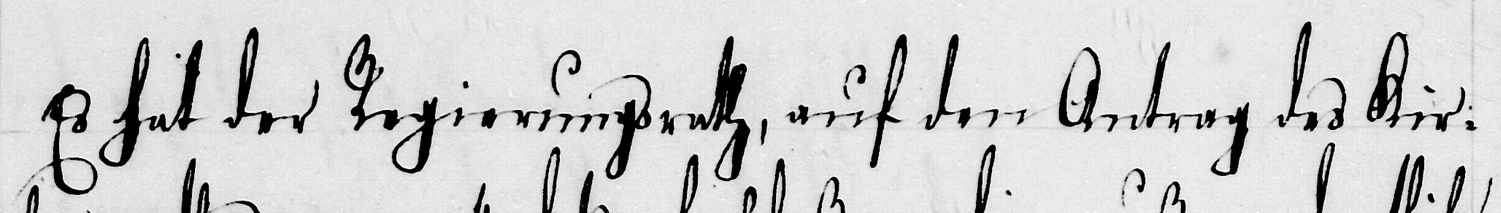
Es hat der Regierungsrath, auf den Antrag des Kir¬
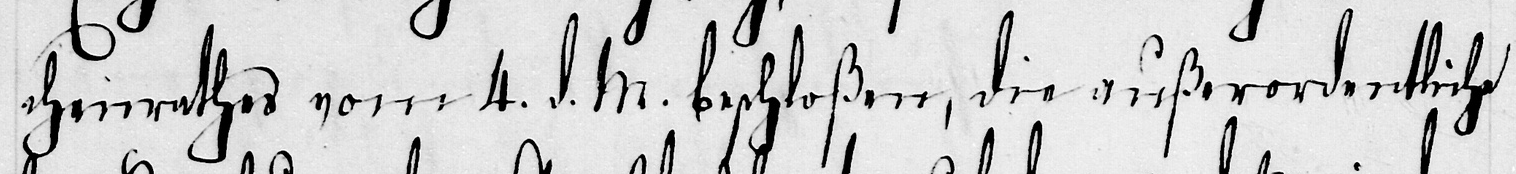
chenrathes vom 4. d. M. beschloßen, die außerordentliche
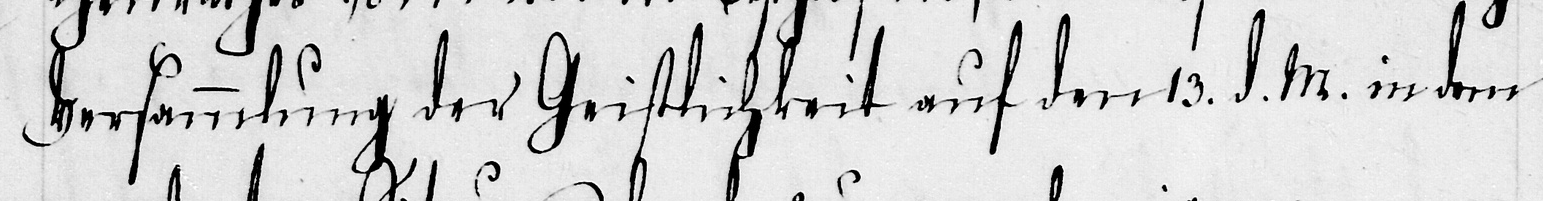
Versammlung der Geistlichkeit auf den 13. d. M. in dem
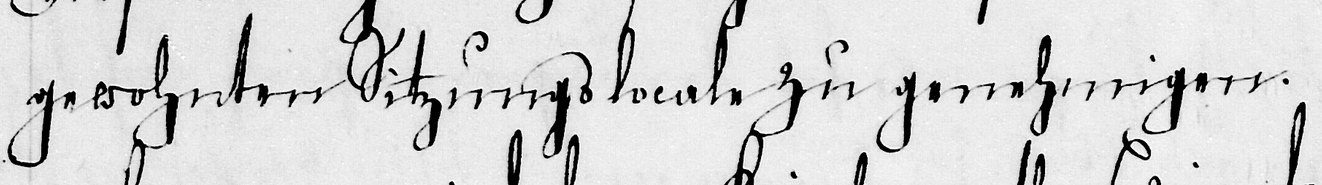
gewohnten Sitzungslocale zu genehmigen.
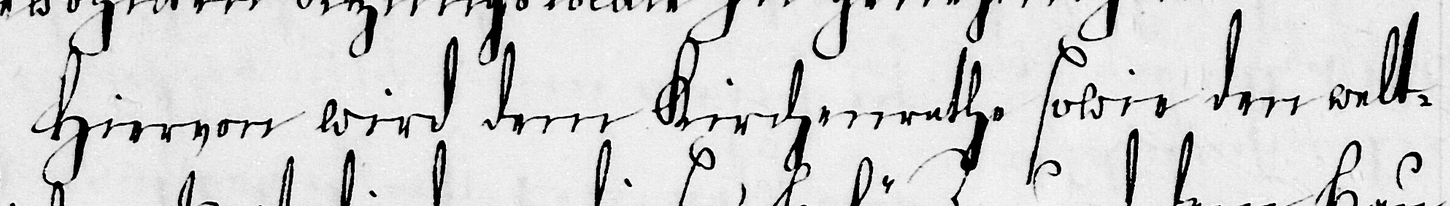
Hiervon wird dem Kirchenrathe sowie den welt¬
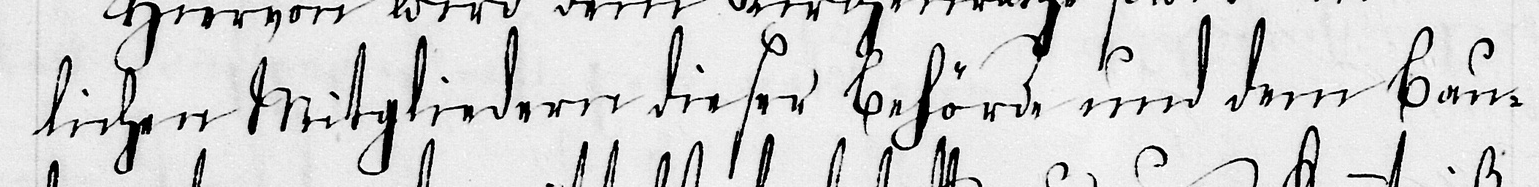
lichen Mitgliedern dieser Behörde und dem Bau¬
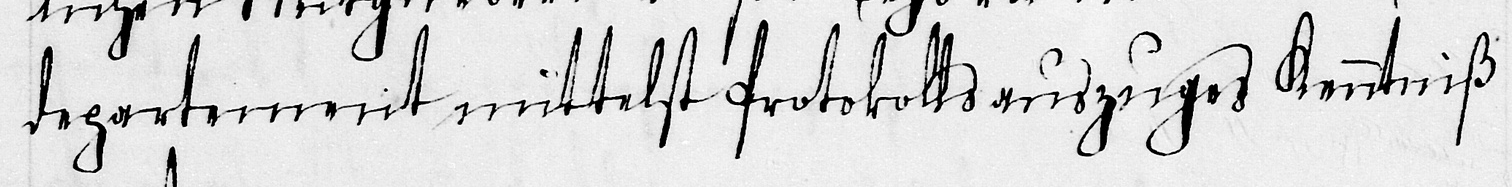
departement mittelst Protokollsauszuges Kenntniß
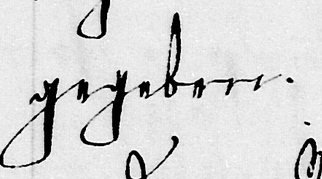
gegeben.
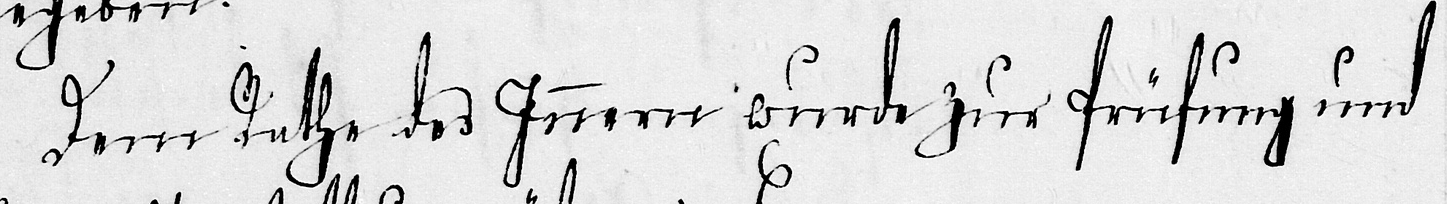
Dem Rathe des Innern wurde zur Prüfung und
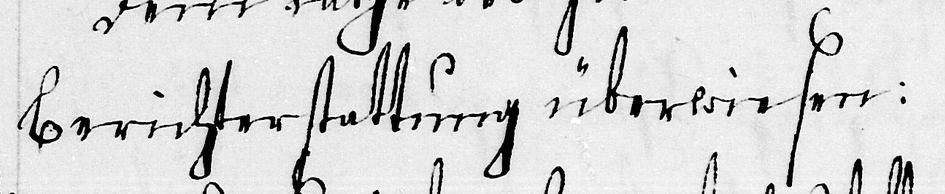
Berichterstattung überwiesen:
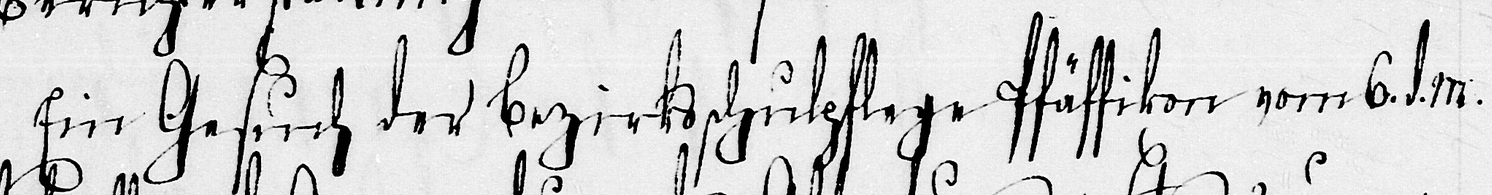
Ein Gesuch der Bezirksschulpflege Pfäffikon vom 6. d.
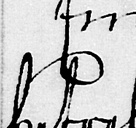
M.
